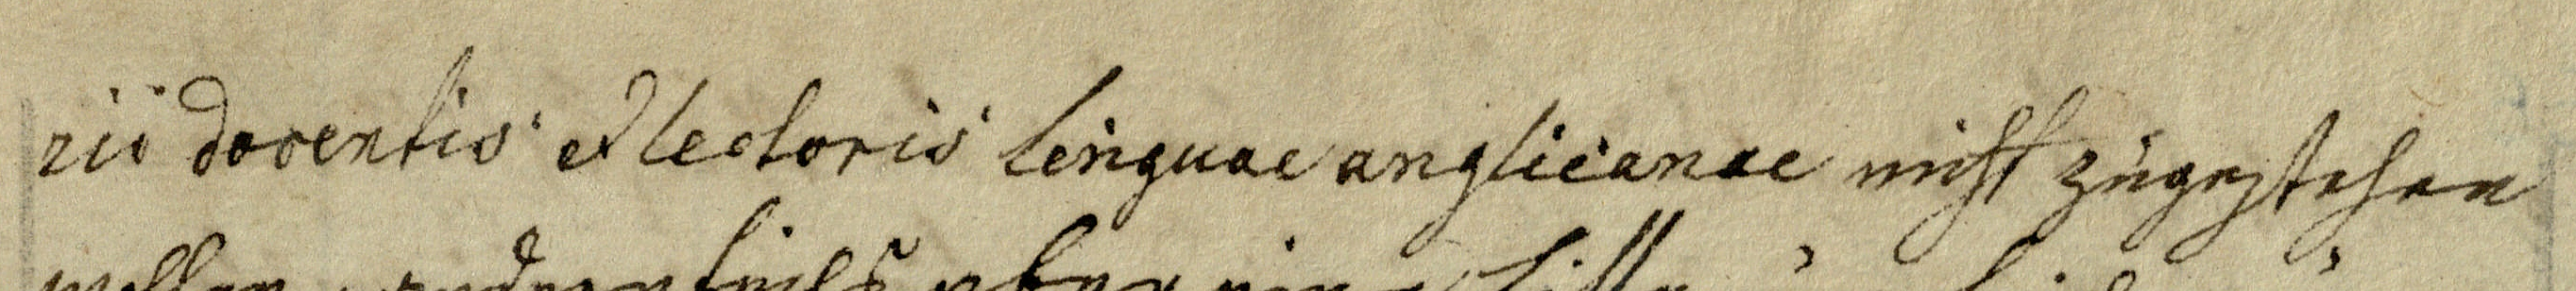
rii docentis et lectoris Linguae anglicanae nicht zugestehen
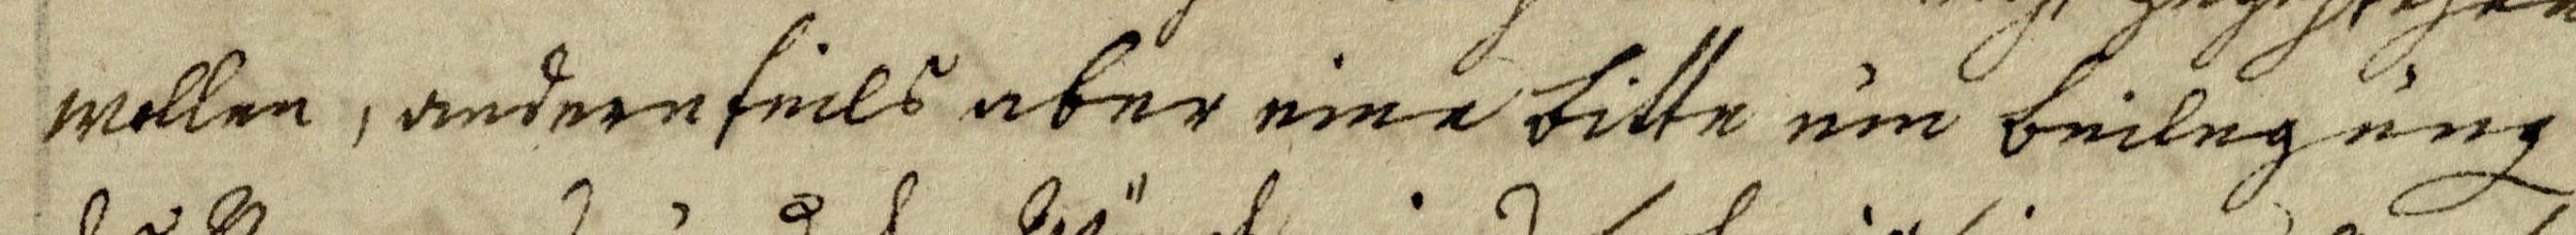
wollen, andern teils aber eine Bitte um Beilegung
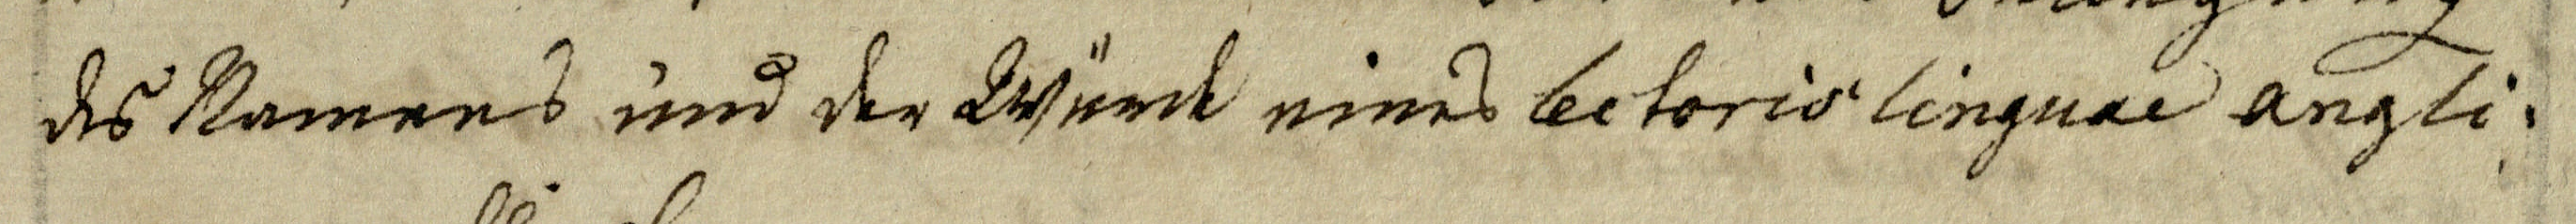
des Namens und der Würde eines lectoris linguae angli¬
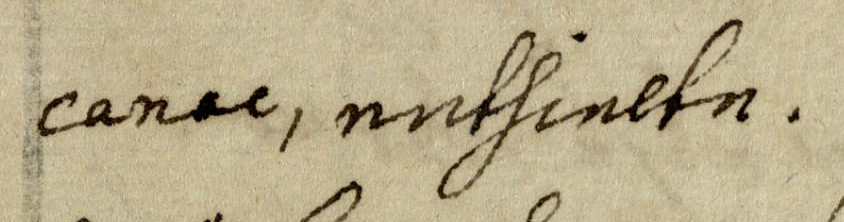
canae, enthielte.
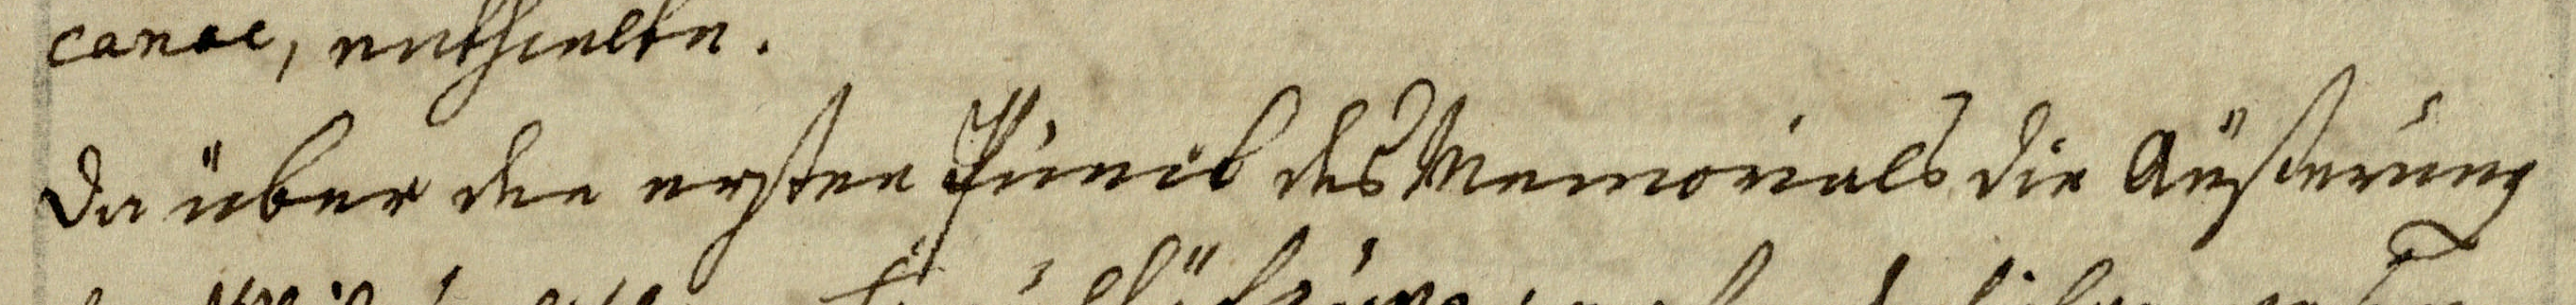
Da über den ersten Punct des Memorials die Äußerung
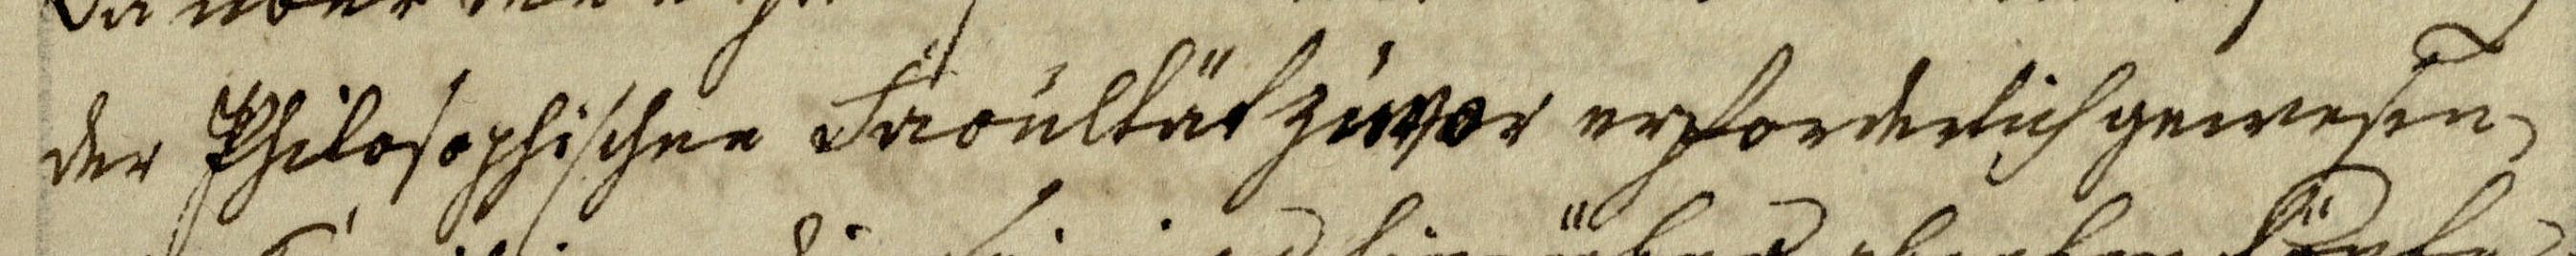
der Philosophischen Facultät zuvor erforderlich gewesen,
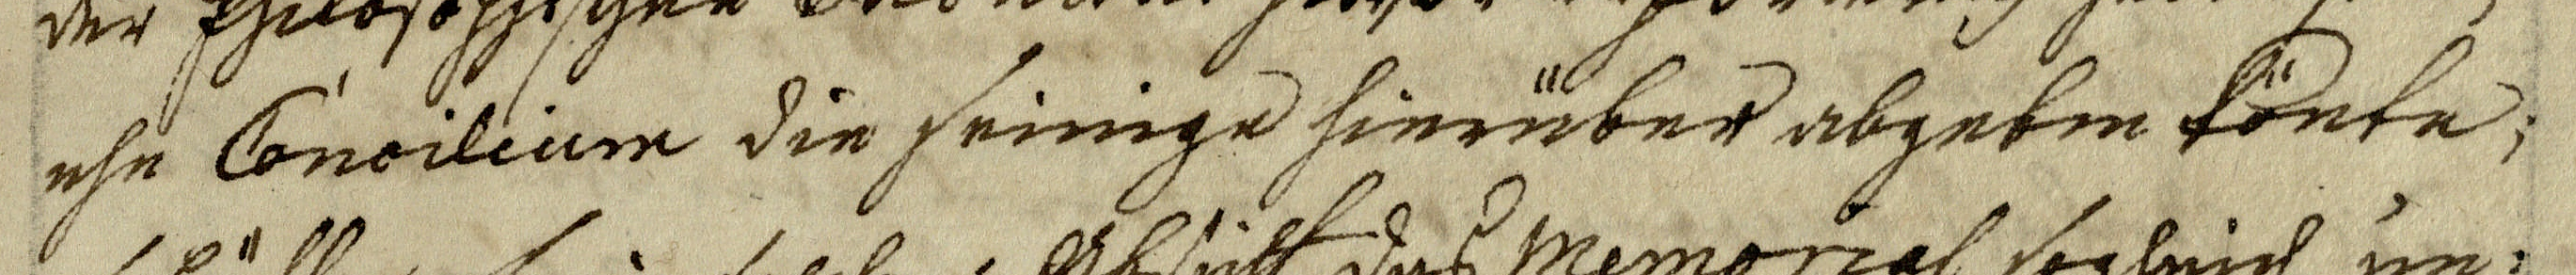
ehe Concilium die seinige hierüber abgeben könte;
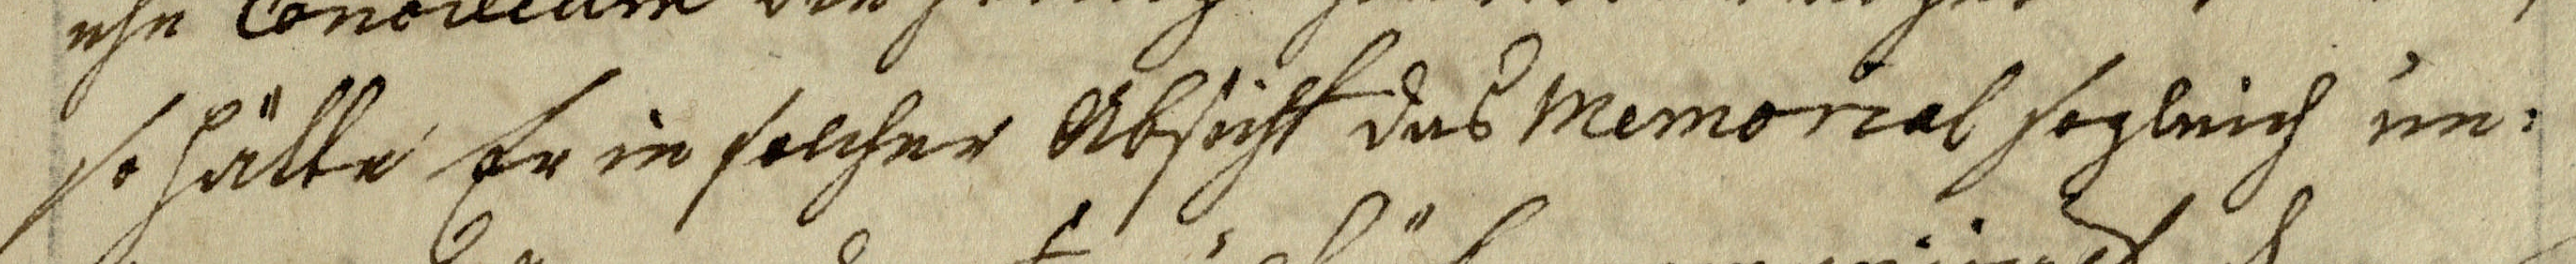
so hätte Er in solcher Absicht das Memorial sogleich un¬
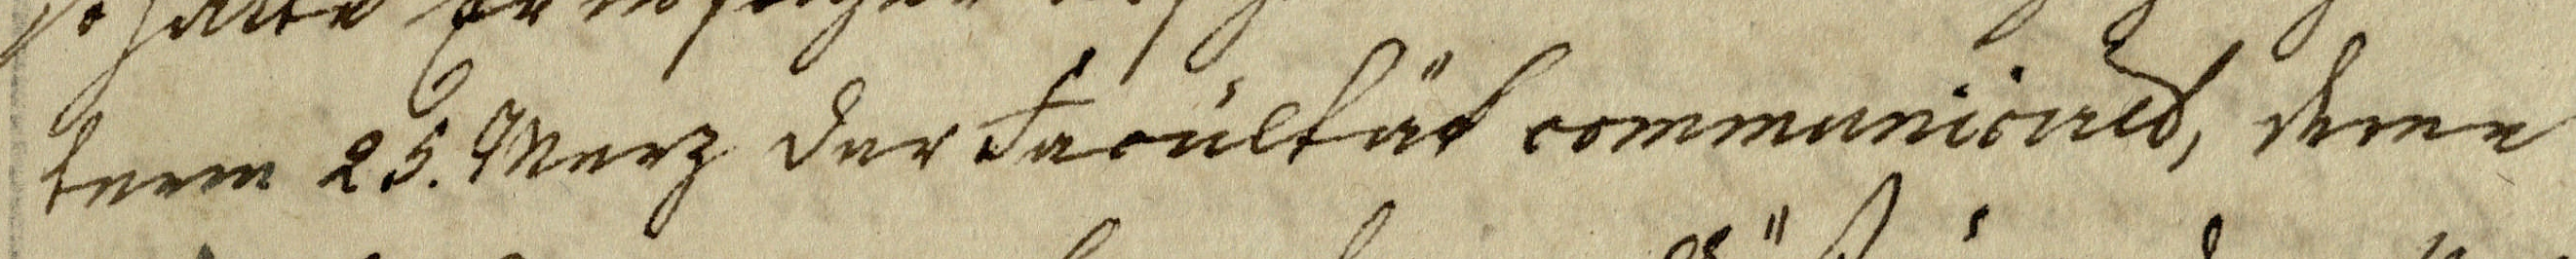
term 25. Merz der Facultät communiciret, deren
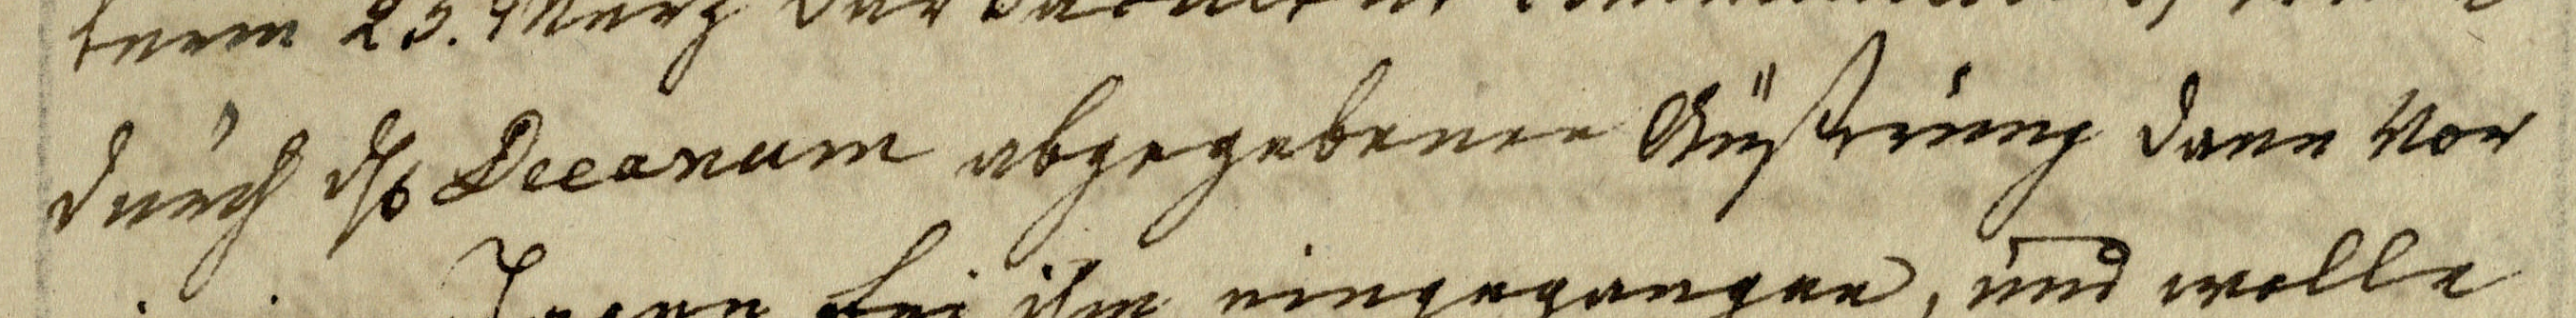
durch dh Decanum abgegebenen Äußerung dann vor
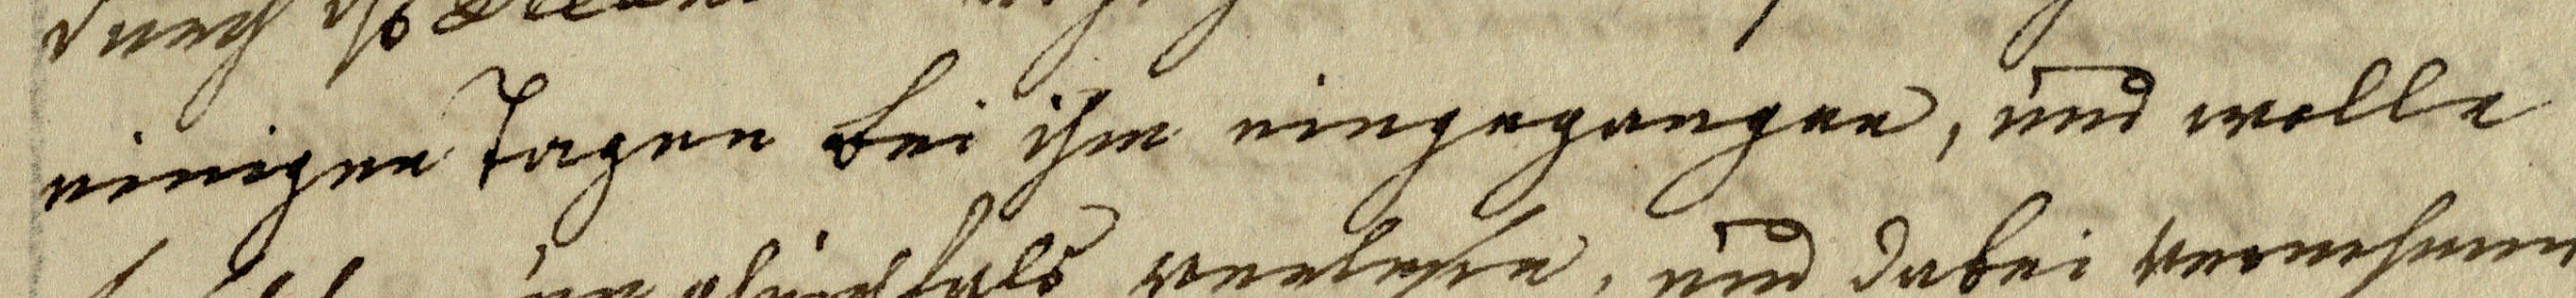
einigen Tagen bei ihm eingegangen, und wolle
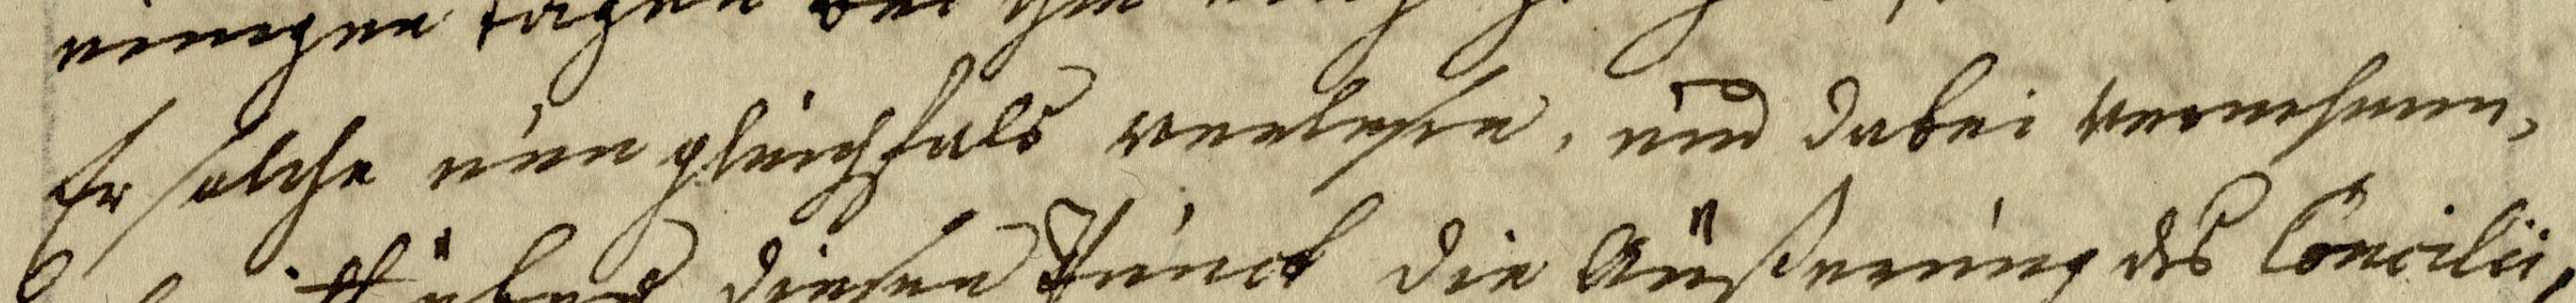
Er solche nun gleichfals verlesen, und dabei vernehmen,
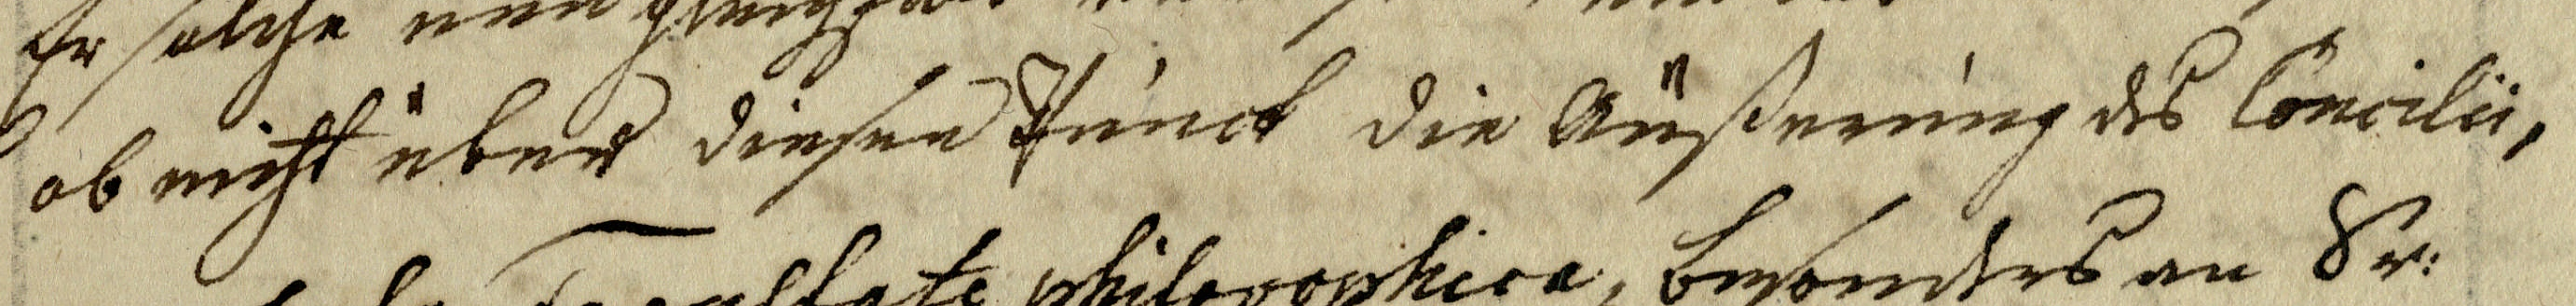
ob nicht über diesen Punct die Äußerung des Concilii,
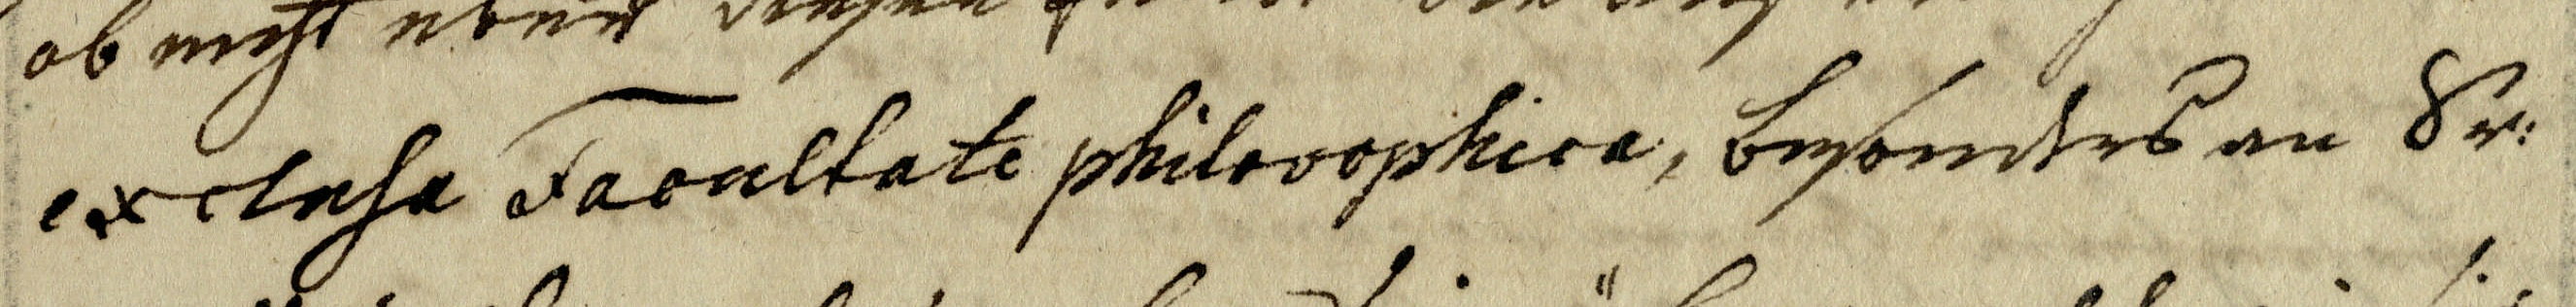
exclusa Facultate philosophica, besonders an Sr
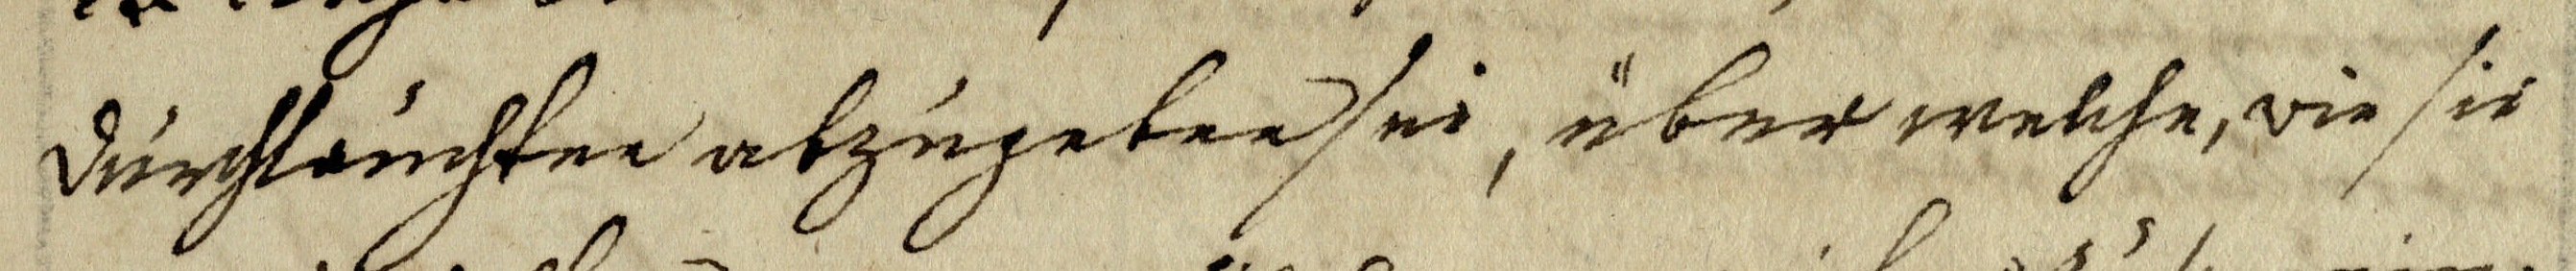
Durchlauchten abzugeben sei, über welche, wie sie
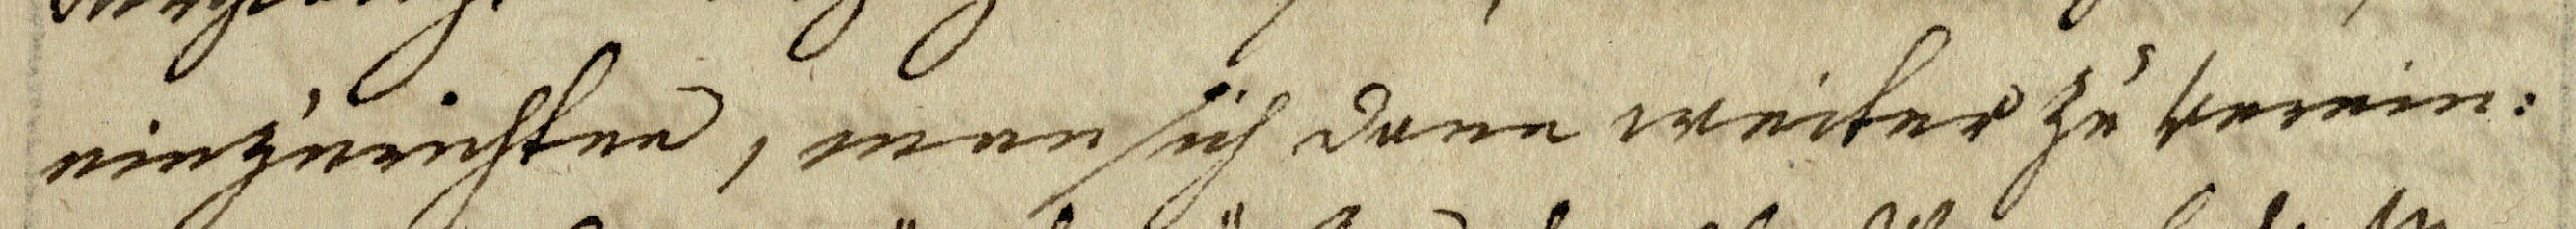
einzurichten, man sich dann weiter zu verein¬
